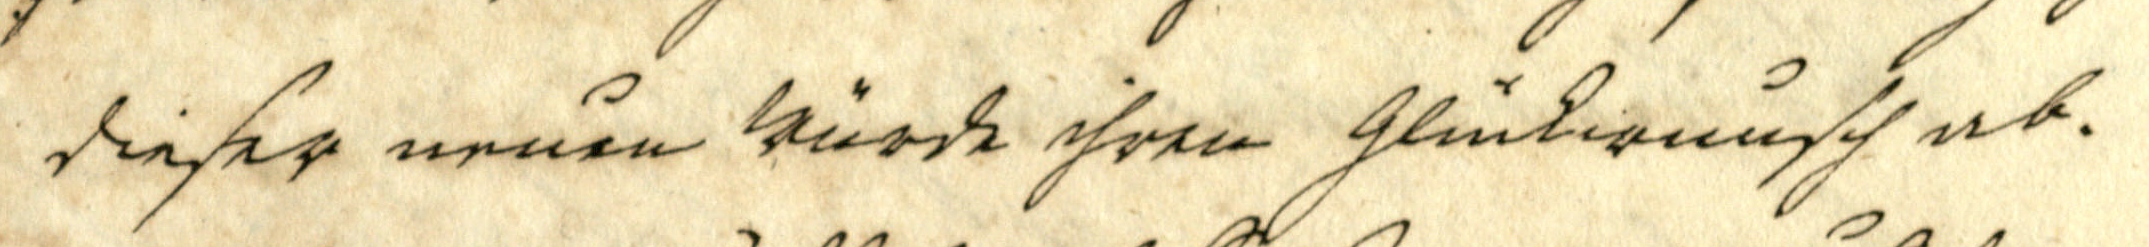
dieser neuen Würde ihren Glückwunsch ab.
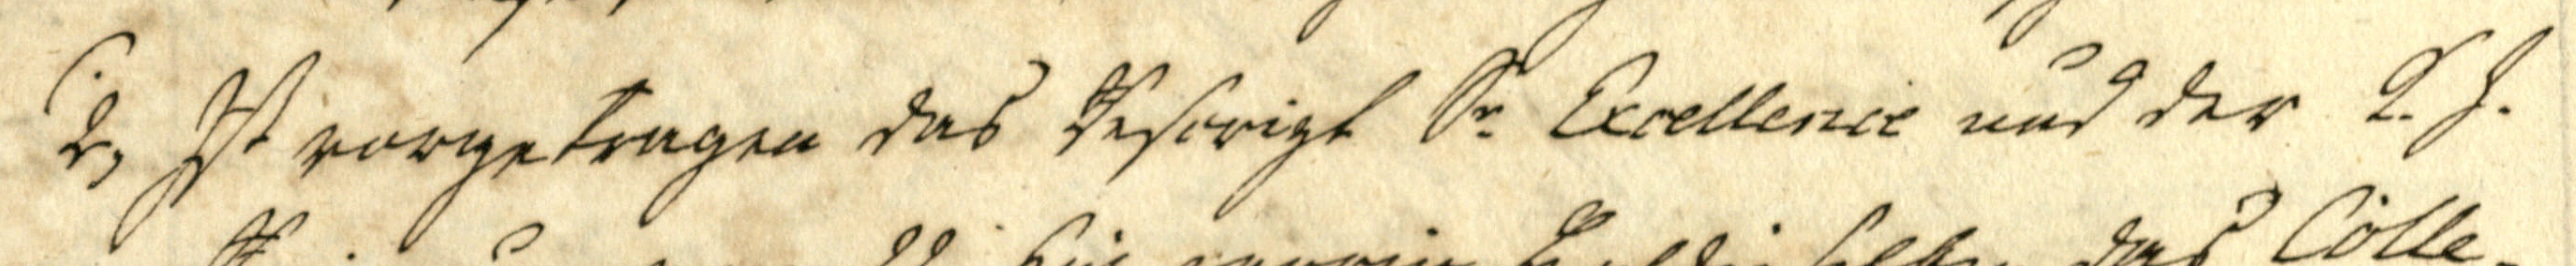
2, Ist vorgetragen das Rescript Sr Excellence und der K. h.
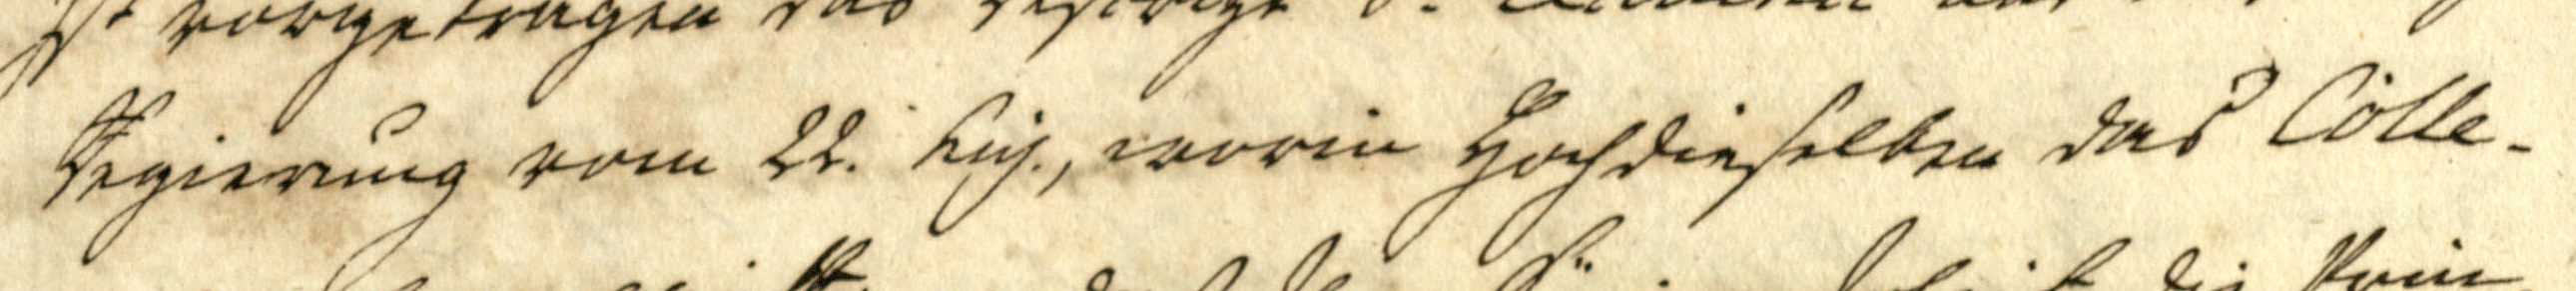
Regierung vom 22. huj., worin Hochdieselben das Colle¬
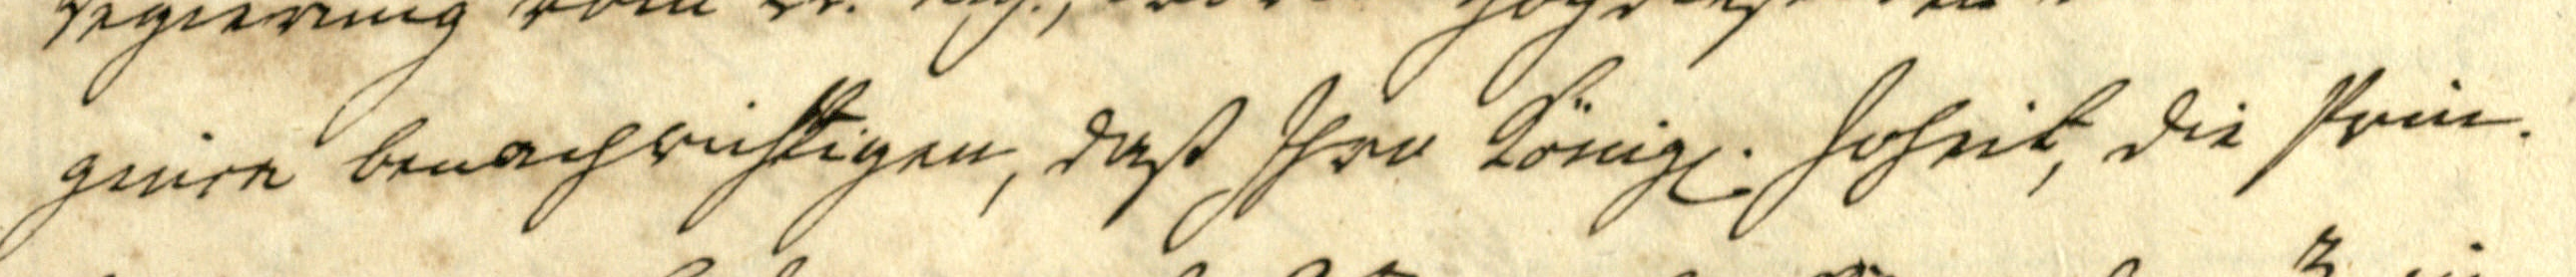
gium benachrichtigen, daß ihre Königl. Hoheit, die Prin¬
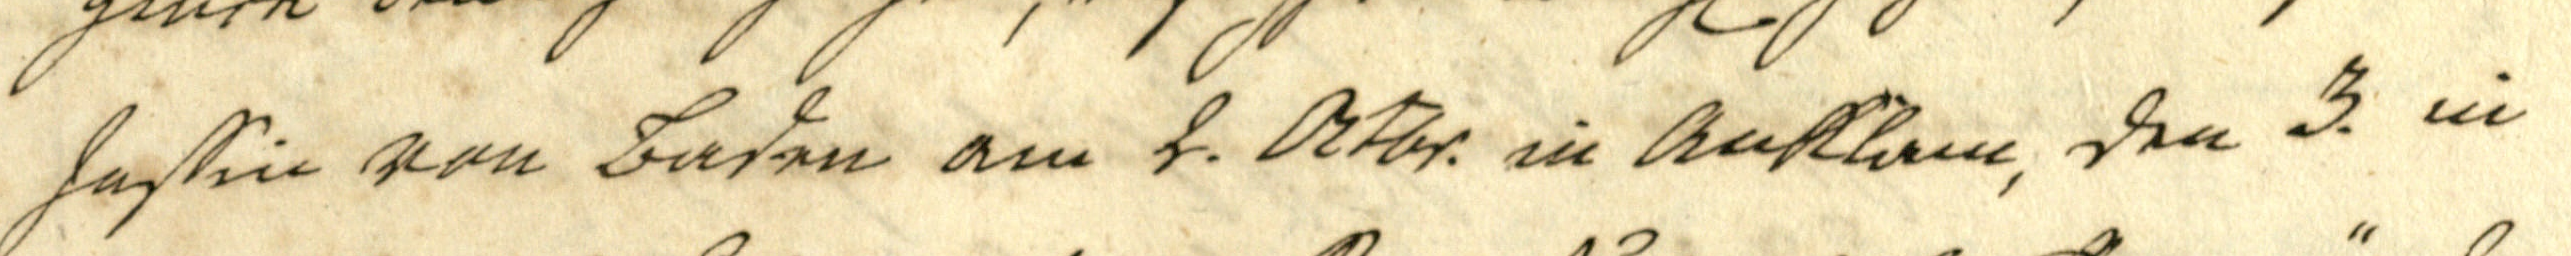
zessin von Baden am 2. Octbr. in Anklam, den 3. in
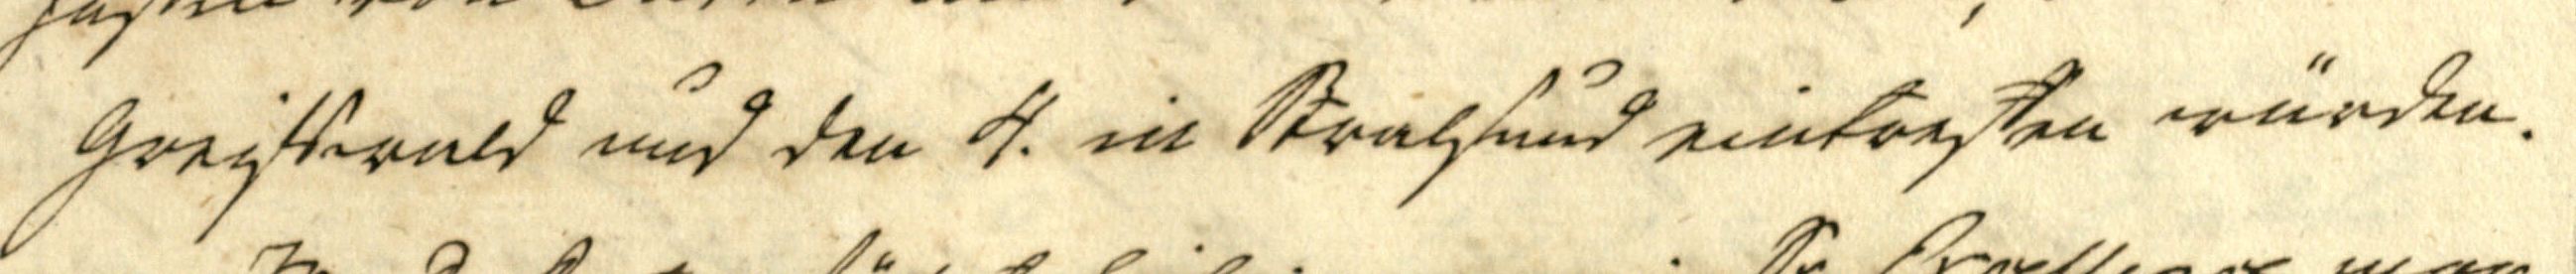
Greifswald und den 4. in Stralsund eintreffen würden.
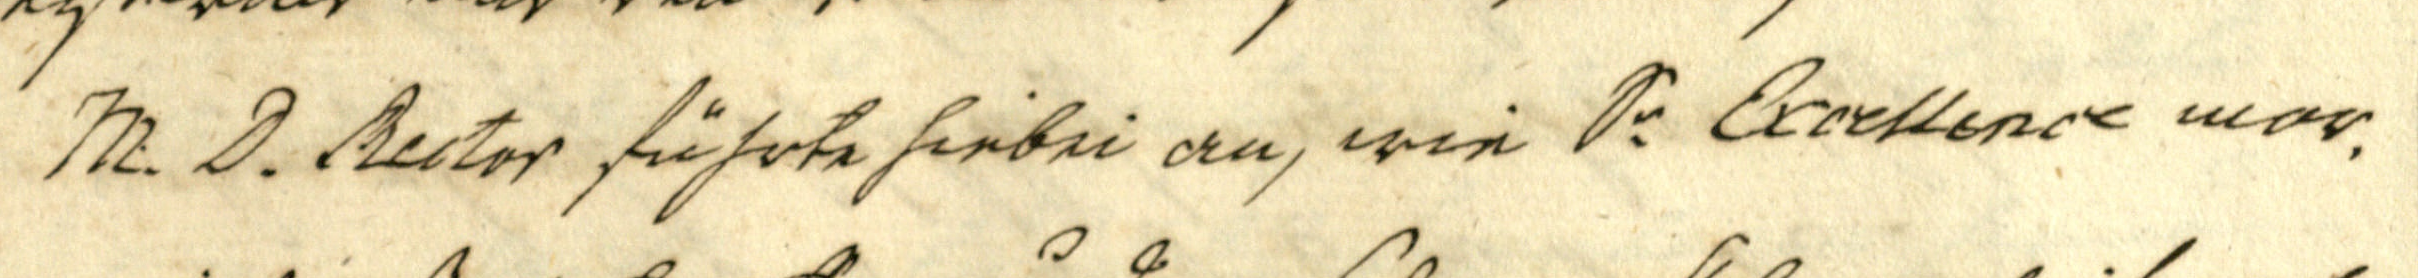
M. D. Rector führte hiebei an, wie Sr Excellence mor¬
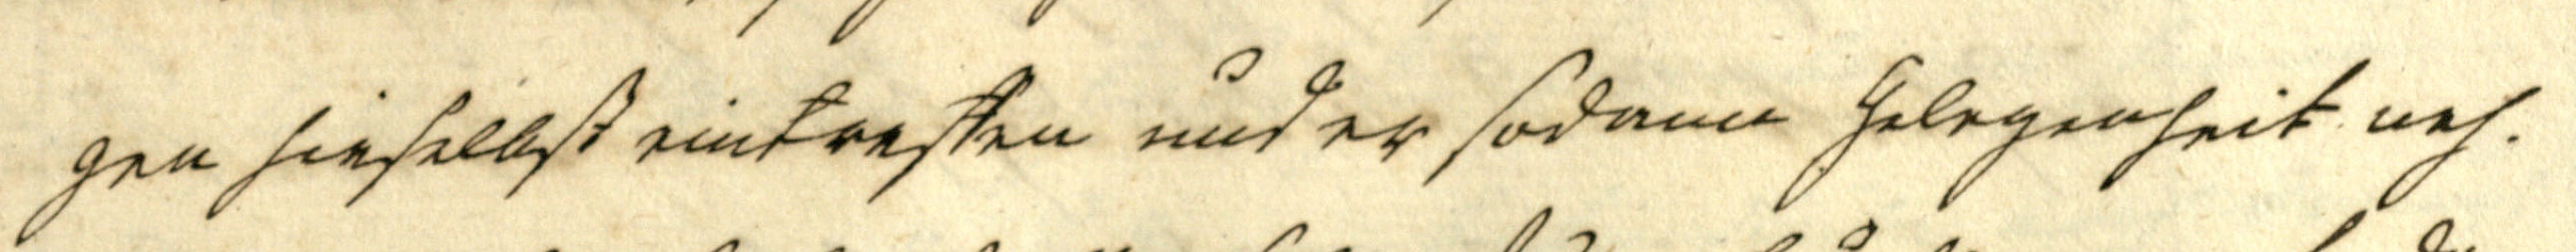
gen hieselbst eintreffen und er sodann Gelegenheit neh¬
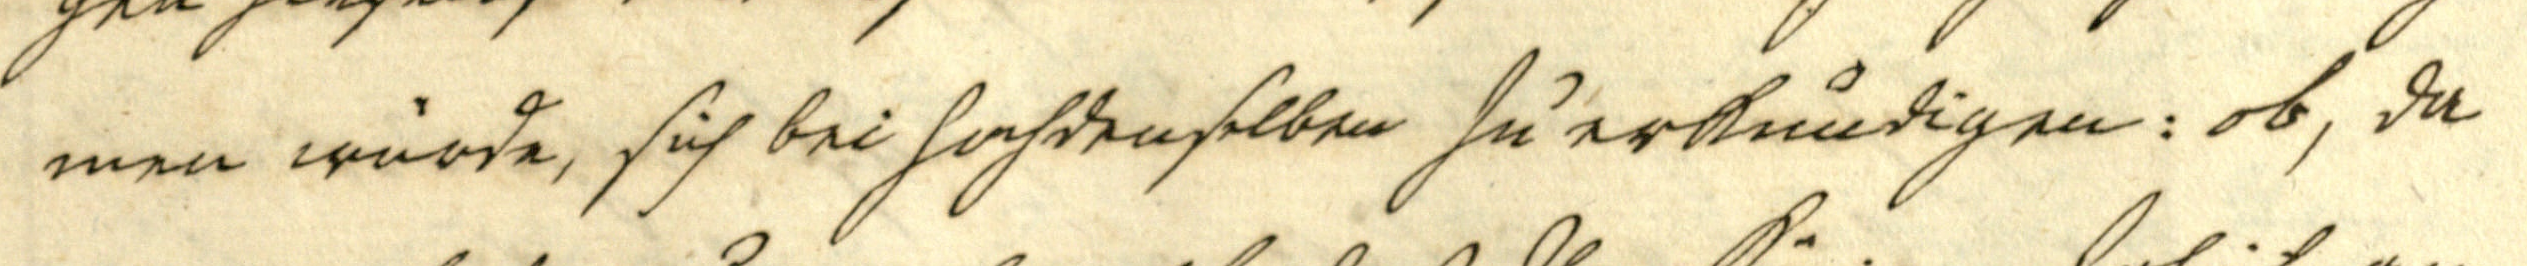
men würde, sich bei Hochdenselben zu erkundigen: ob, da
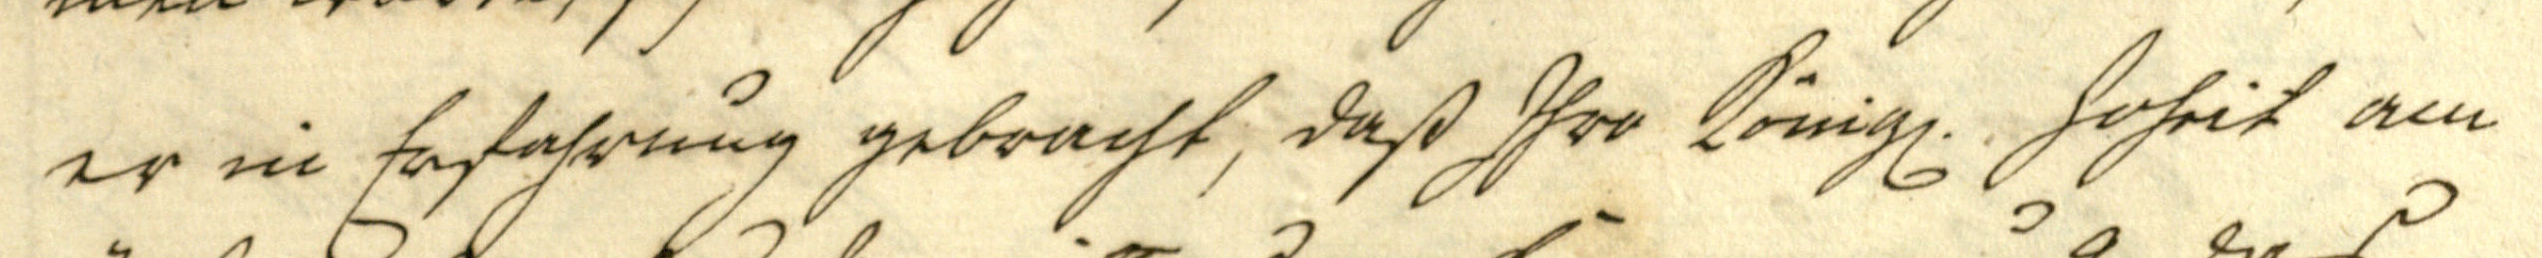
er in Erfahrung gebracht, daß Ihro Königl. Hoheit am
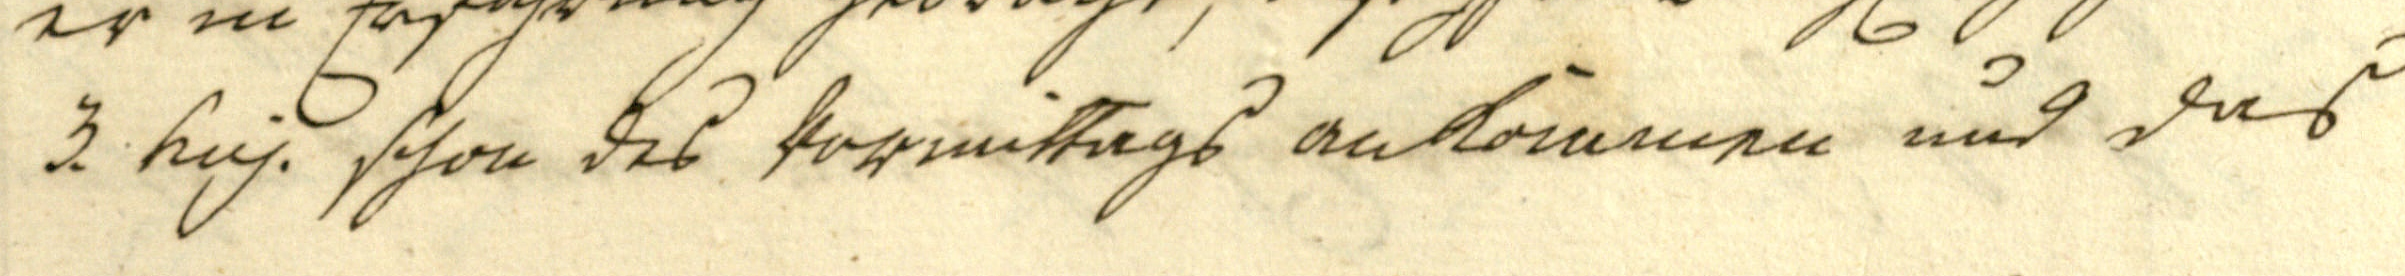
3. huj. schon des Vormittags ankommen und das
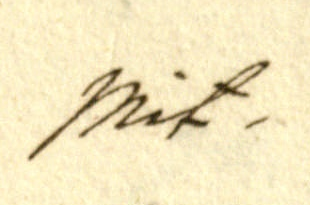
Mit.
